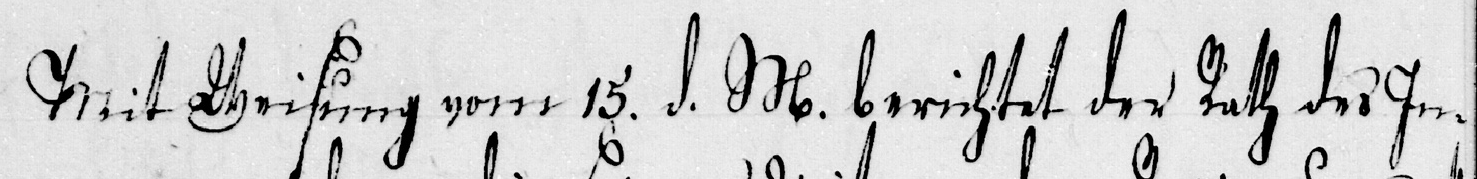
Mit Weisung vom 15. d. M. berichtet der Rath des In¬
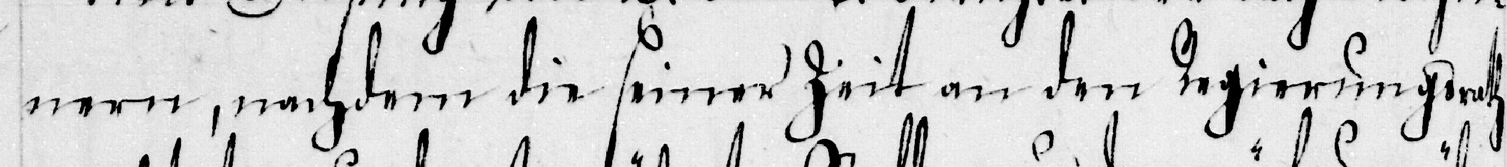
nern, nachdem die seiner Zeit an den Regierungsr¬
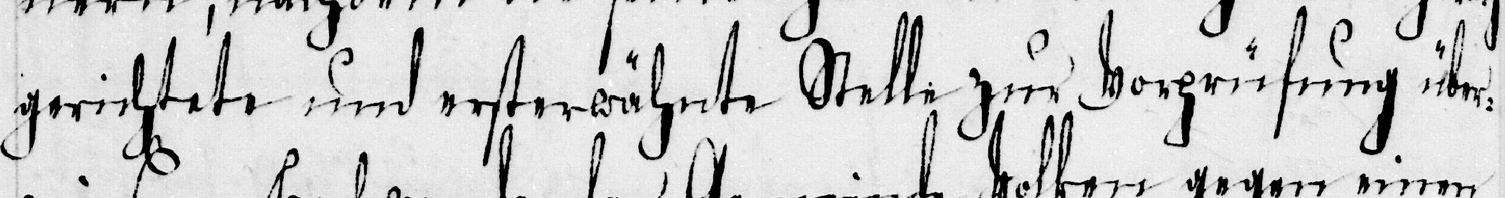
gerichtete und ersterwähnte Stelle zur Vorprüfung übe¬
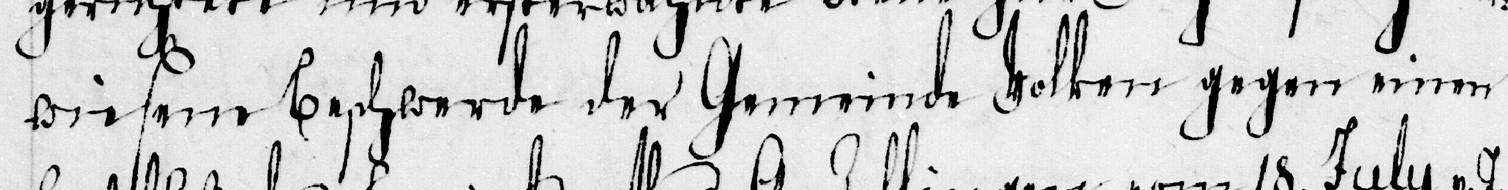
rwiesene Beschwerde der Gemeinde Volken gegen einen
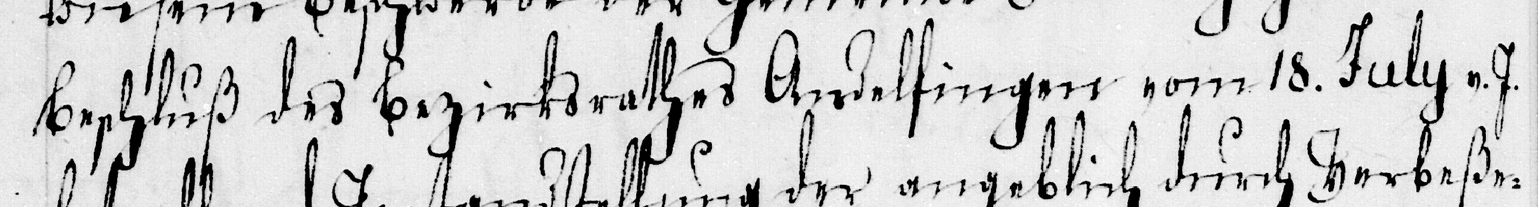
Beschluß des Bezirksrathes Andelfingen vom 18. July v.
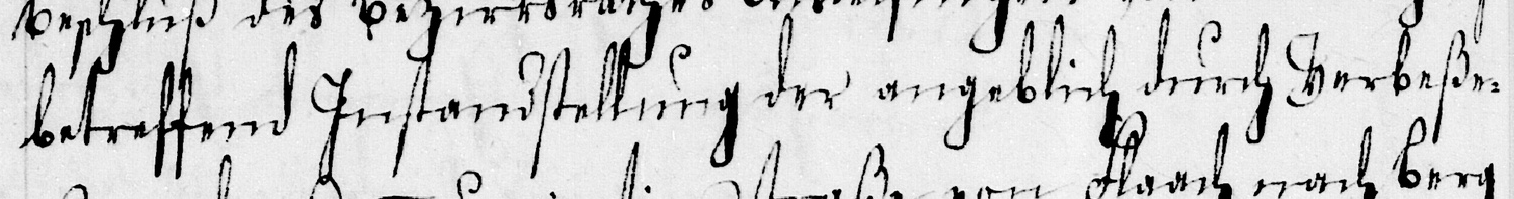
betreffend Instandstellung der angeblich durch Verbeße¬
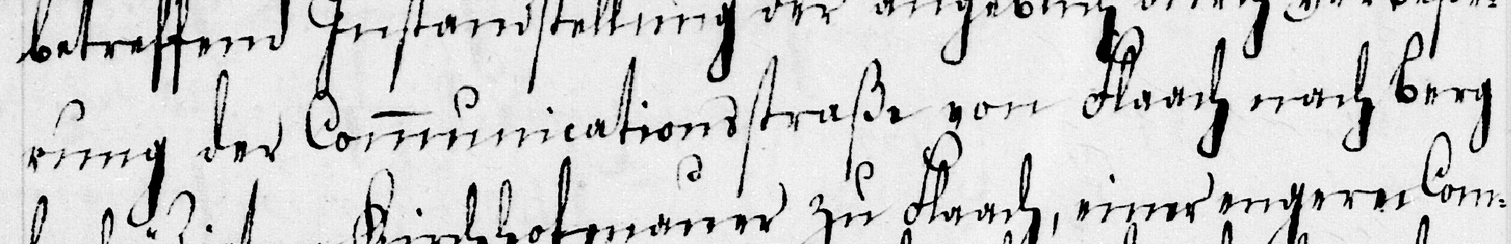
rung der Communicationsstraße von Flaach nach Berg
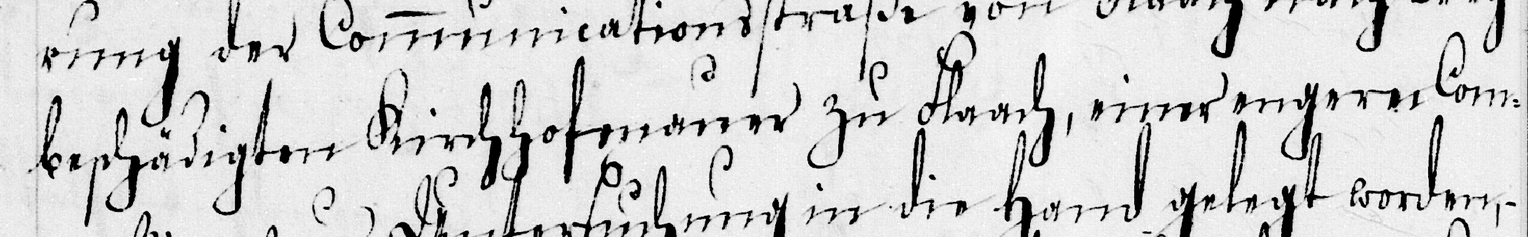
beschädigten Kirchhofmauer zu Flaach, einer engern Com¬
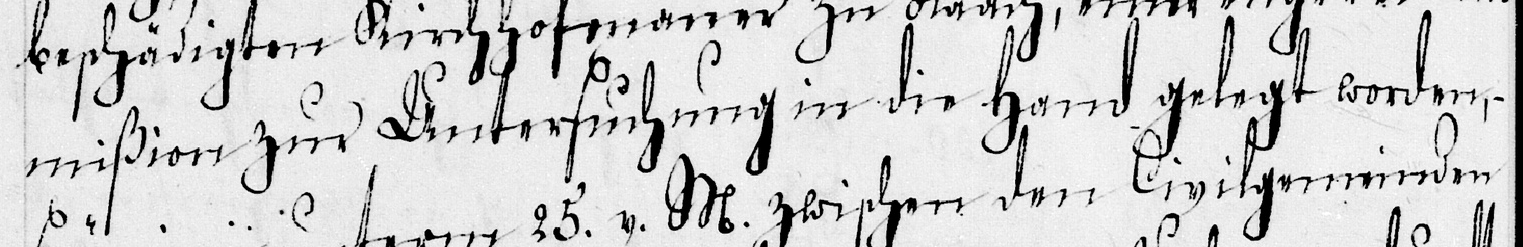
mißion zur Untersuchung in die Hand gelegt worden,–
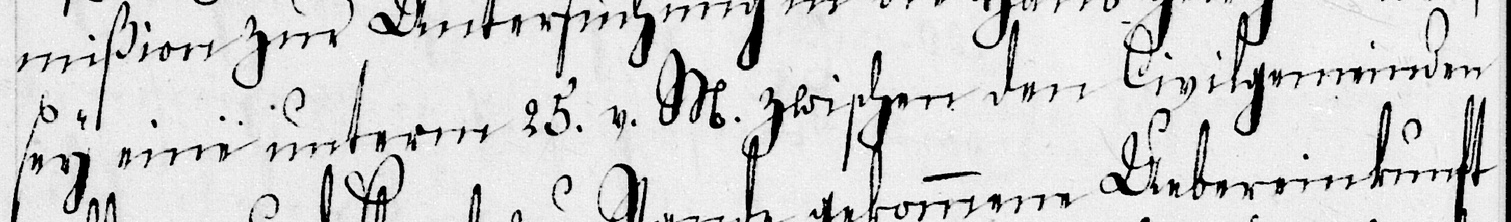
sey eine unterm 25. v. M. zwischen den Civilgemeinden
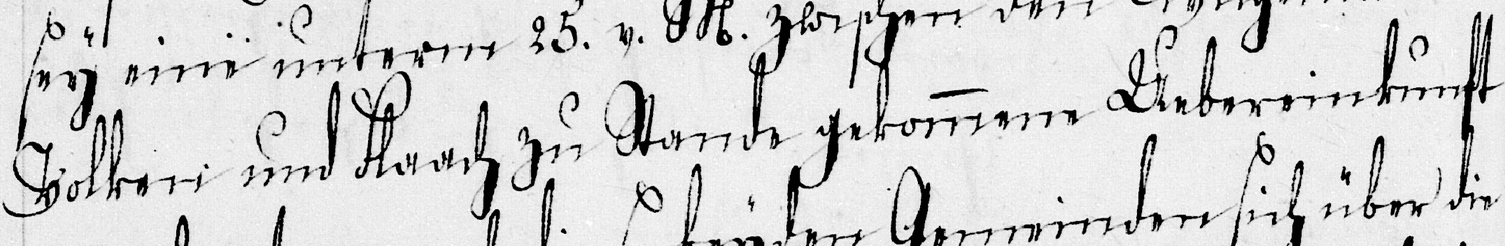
Volken und Flaach zu Stande gekommene Uebereinkunft
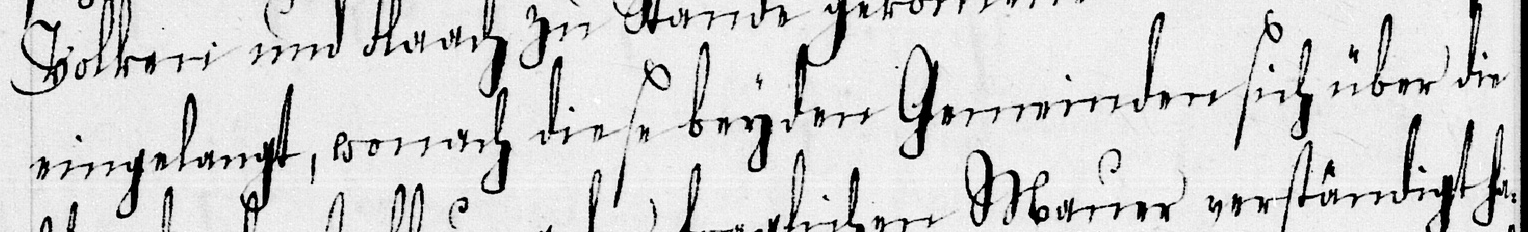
eingelangt, wonach diese beyden Gemeinden sich über die
